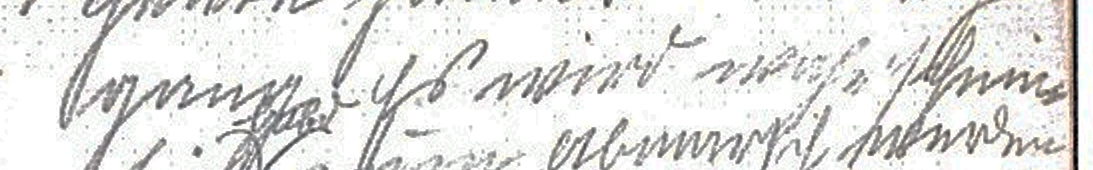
gang. Es wird wahrschein-
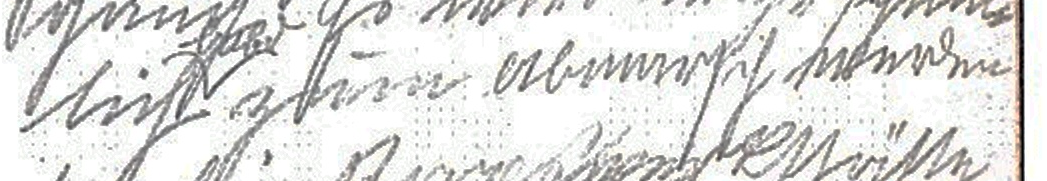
lich bald zum Abmarsch werden
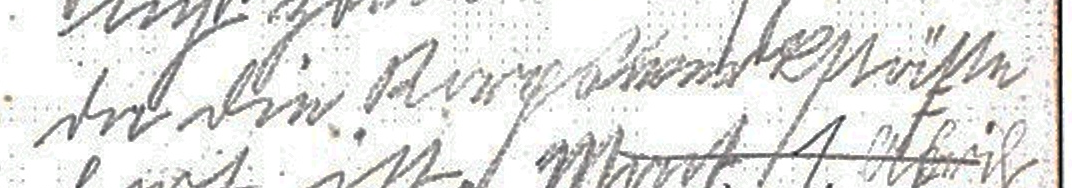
da die Kriegswerkstätte
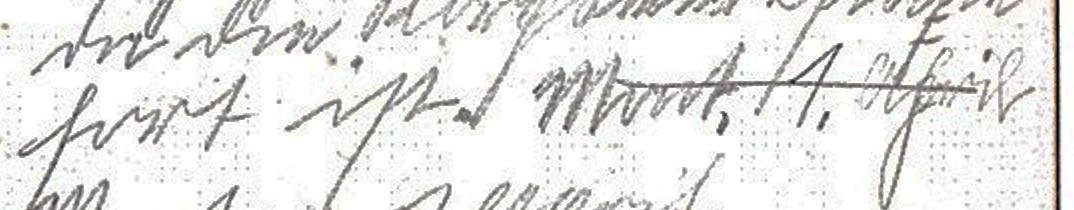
fort ist.
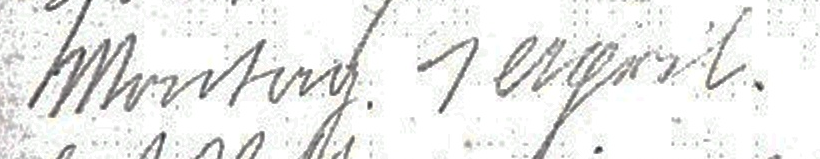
Montag 1. April
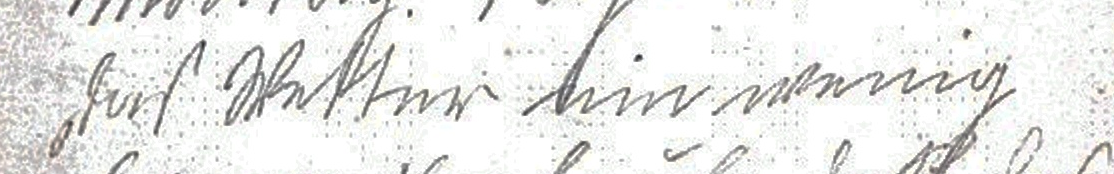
das Wetter ein wenig
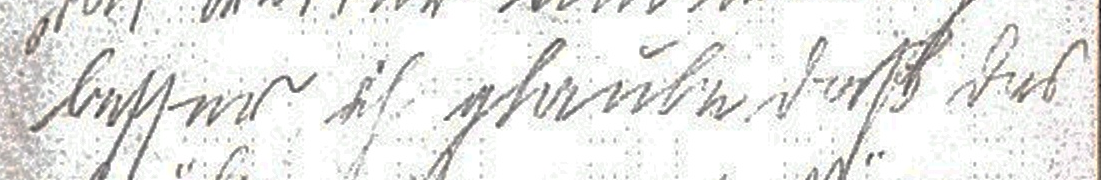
besser ich glaube daß der
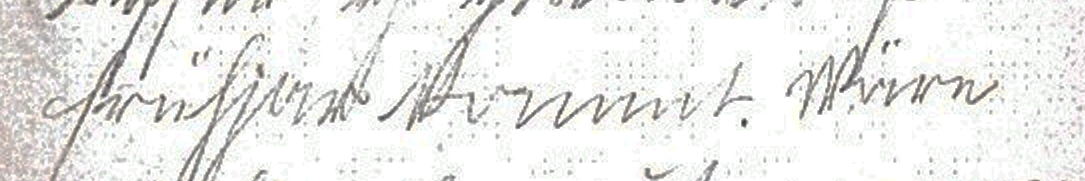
Frühling kommt. Wäre
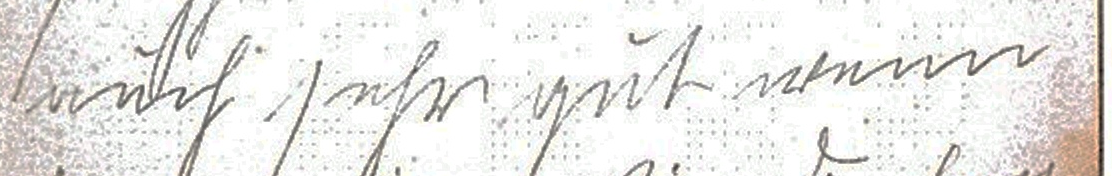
auch sehr gut wenn
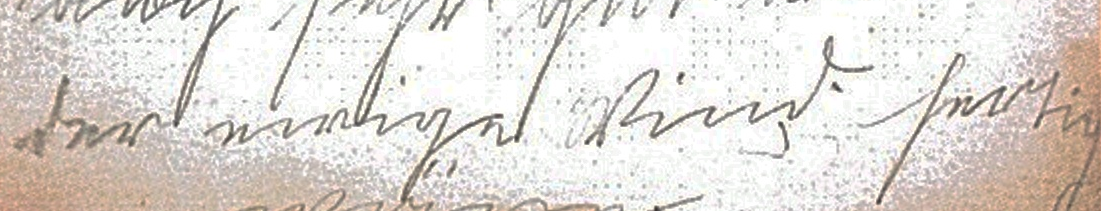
der eirige Wind fertig
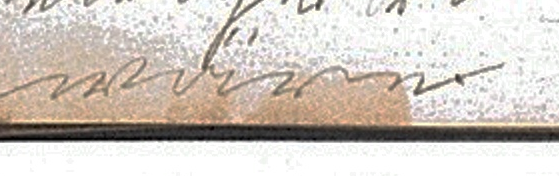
würde.
